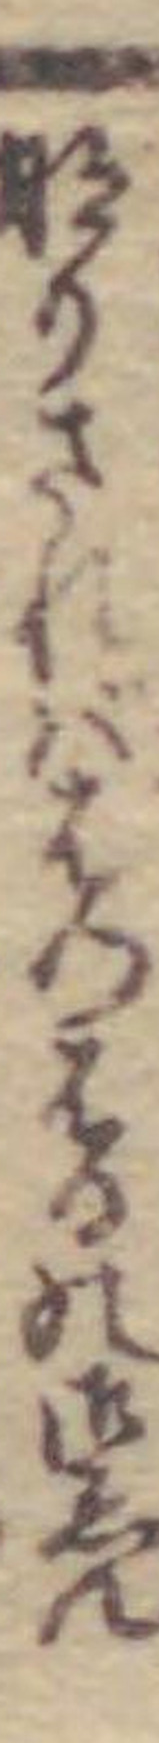なりさればはつはるの御しん
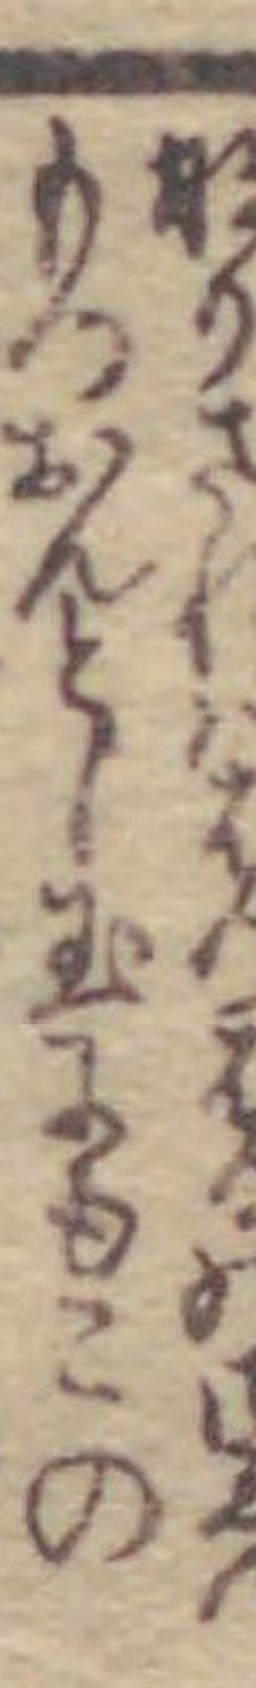もつおんとし玉にもこの
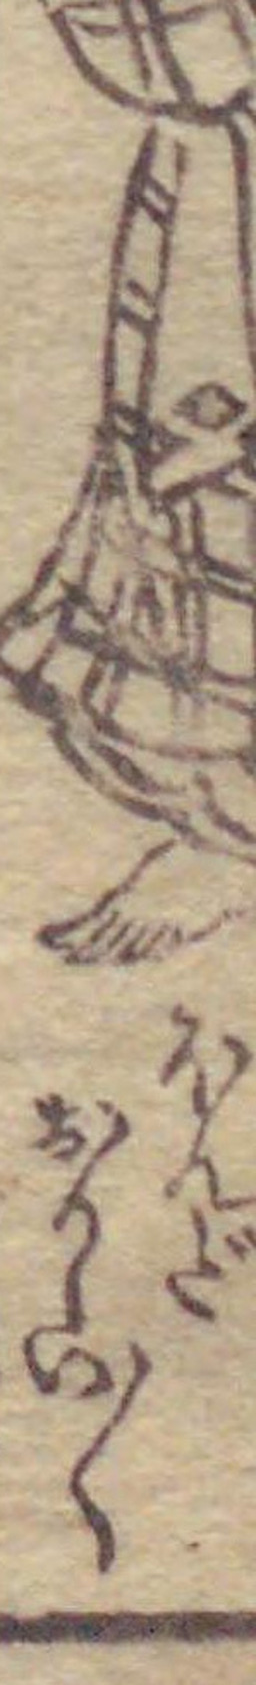おかしい〳〵
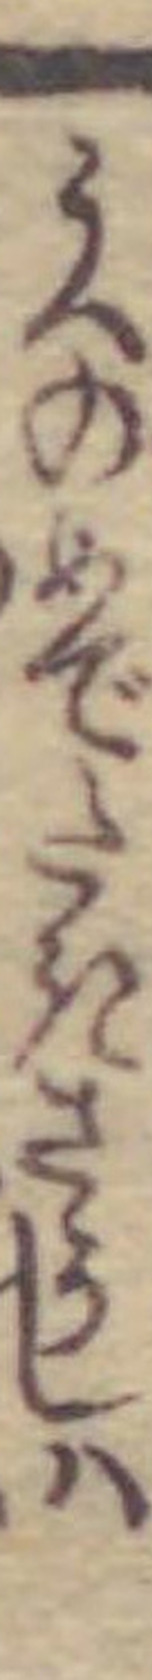うへのめでたきさうしは
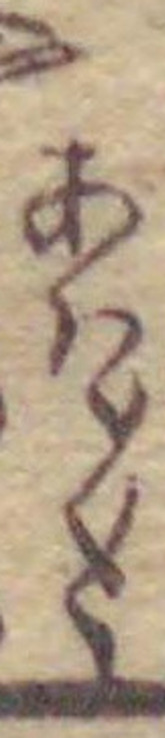あはゝ〳〵〳〵
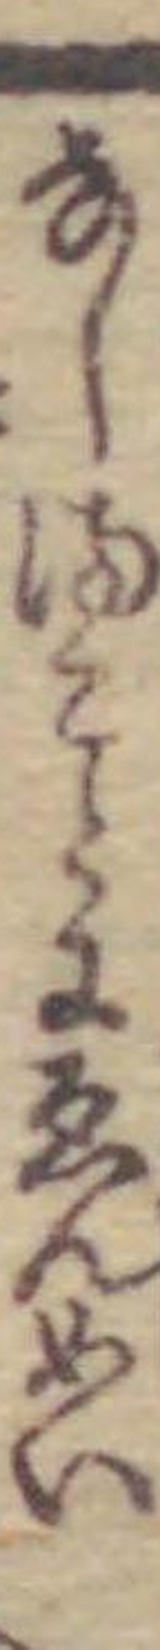なしまことにゑんめい
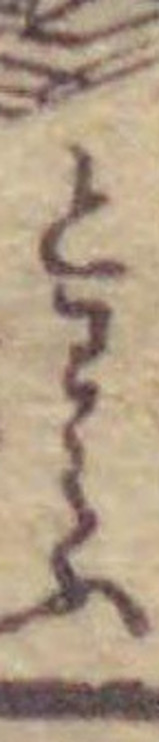とわらふ
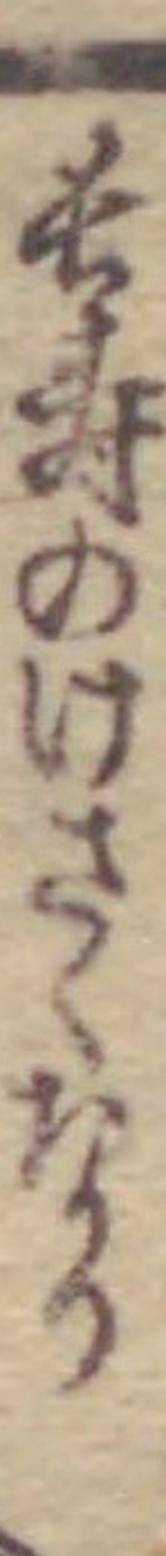長寿のけさくなり
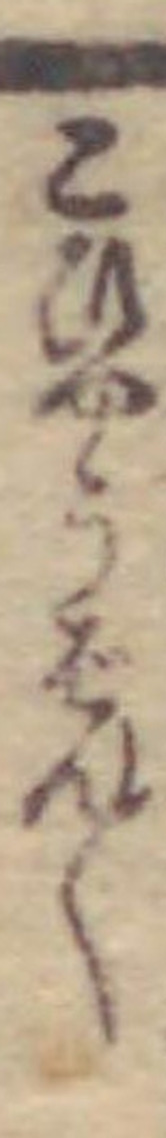こひやうばん〳〵
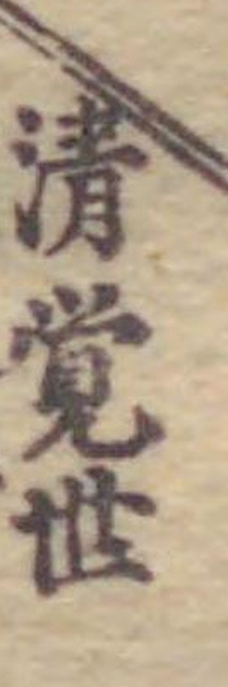清覚世
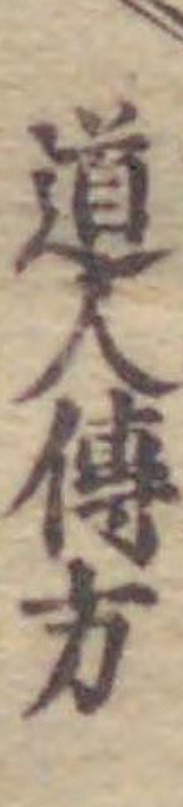道人伝方
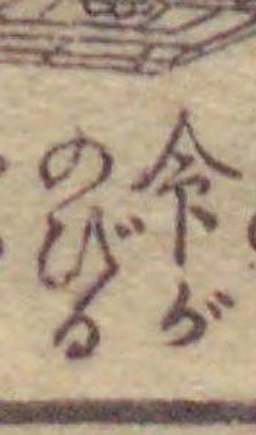のびる
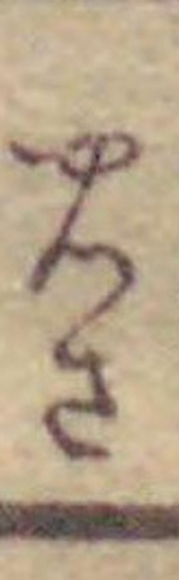やつさ
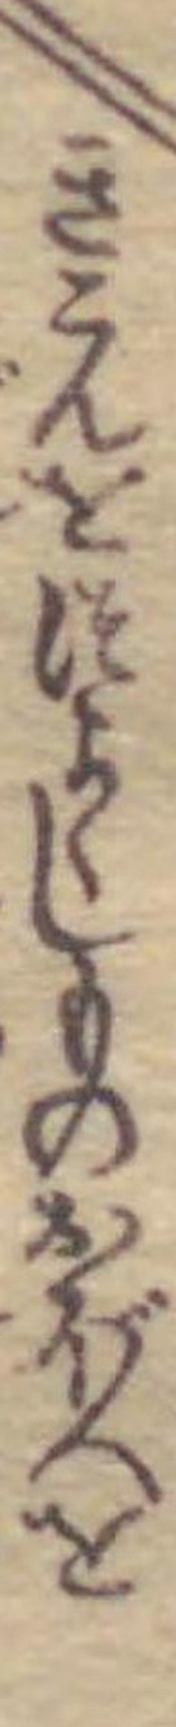きこんをつよくしものおぼへを
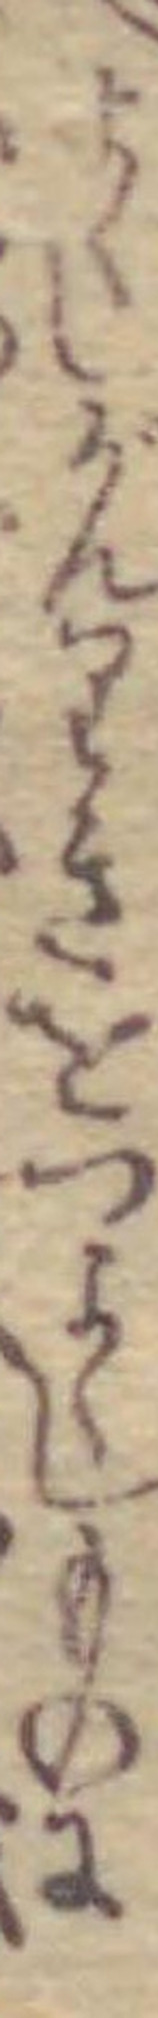よくしがんりきをつよくしものに
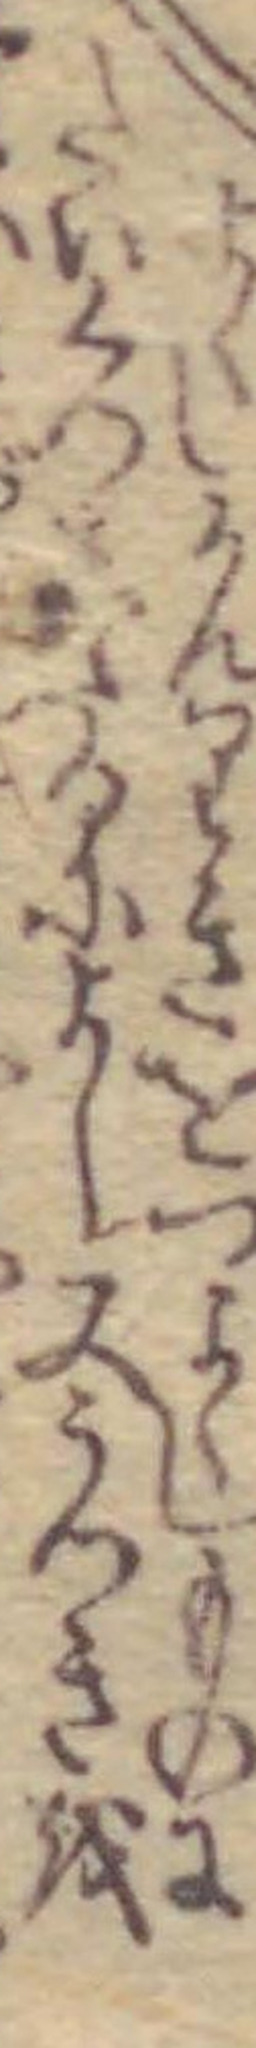たいくつしたるによし又うつきを
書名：御誂染長寿小紋 : 3巻
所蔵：国立国会図書館 National Diet Library, JAPAN
